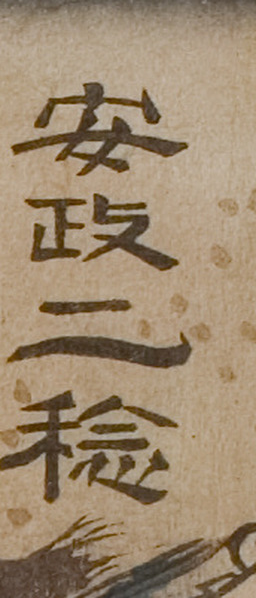安政二稔
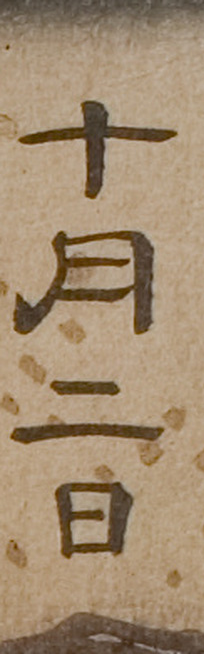十月二日
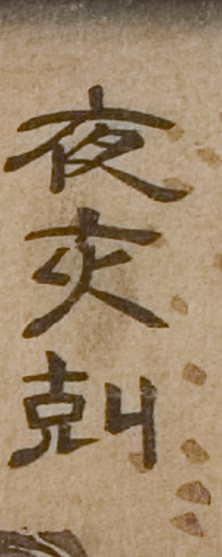夜亥剋
